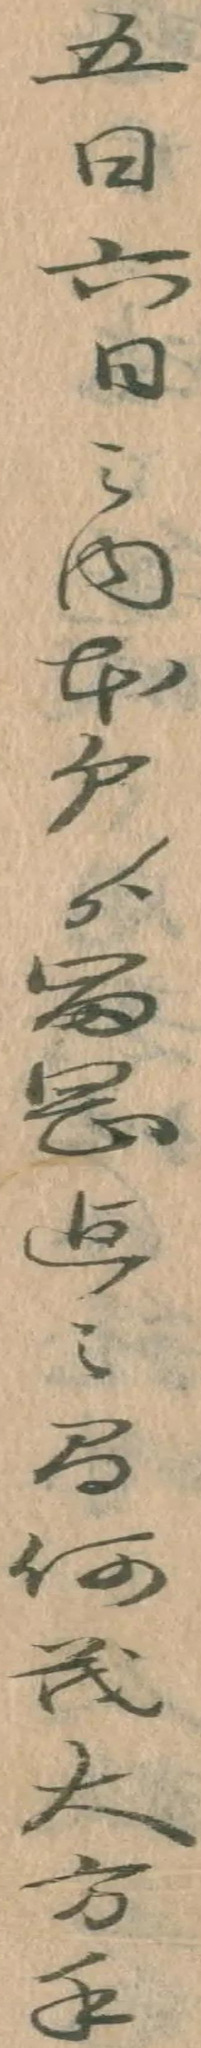五日六日之内本戸ゟ富岡迄之間何も大方手
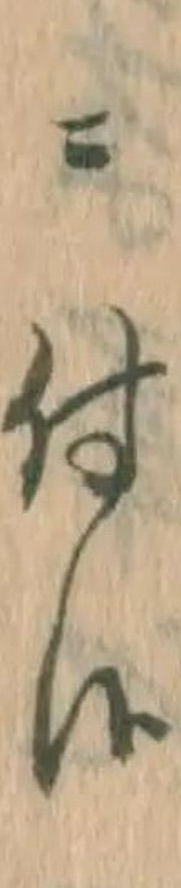に付候
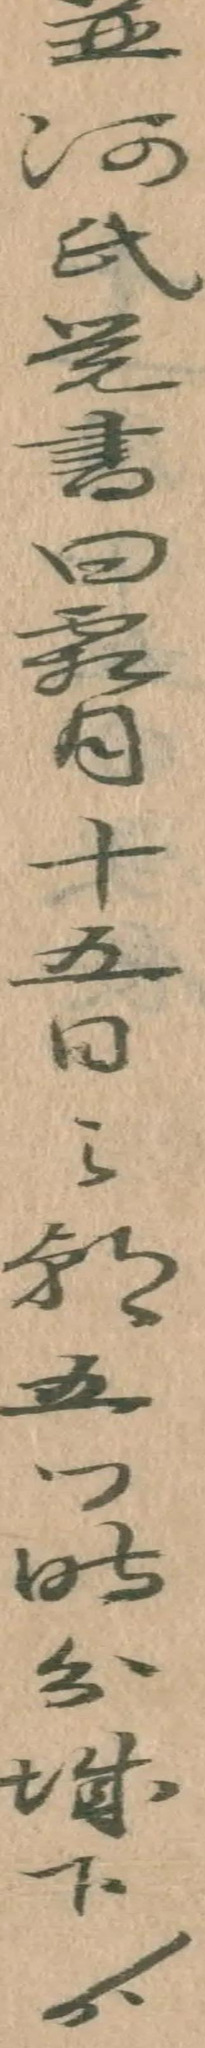並河氏覚書曰霜月十五日之朝五ッ時分城下ゟ
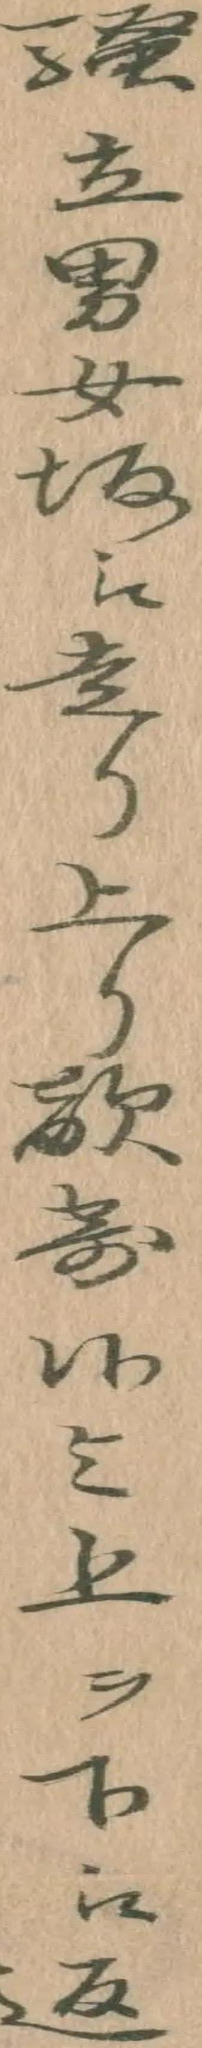騒立男女坂江走り上り敵寄候と上ヲ下江返
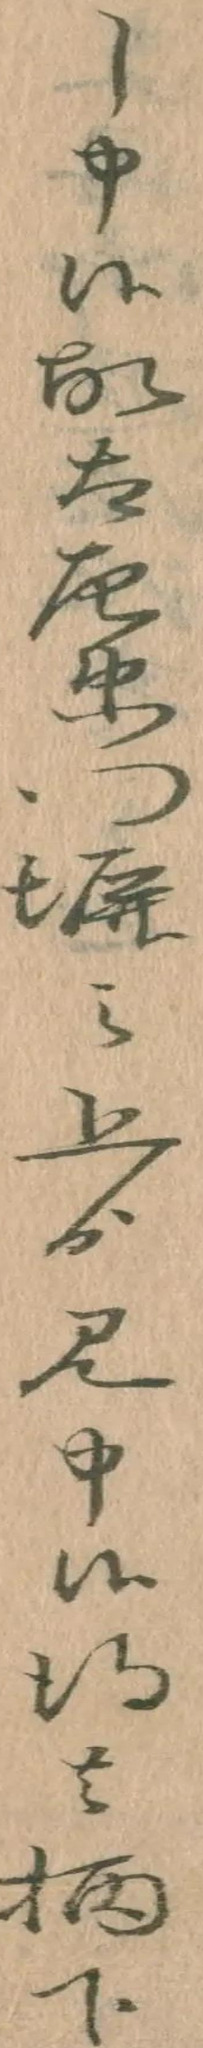し申候故太左衛門塀之上ゟ見申候得は柄下
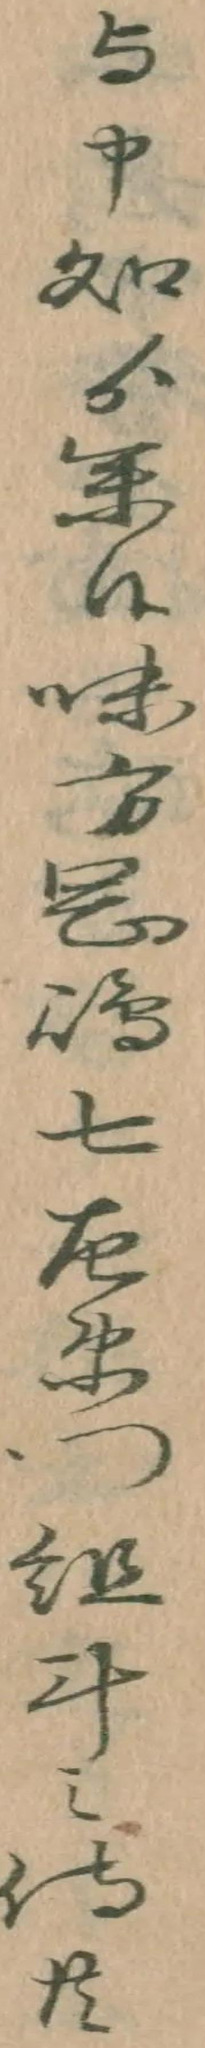と申処ゟ参候味方岡島七左衛門組斗之侍共
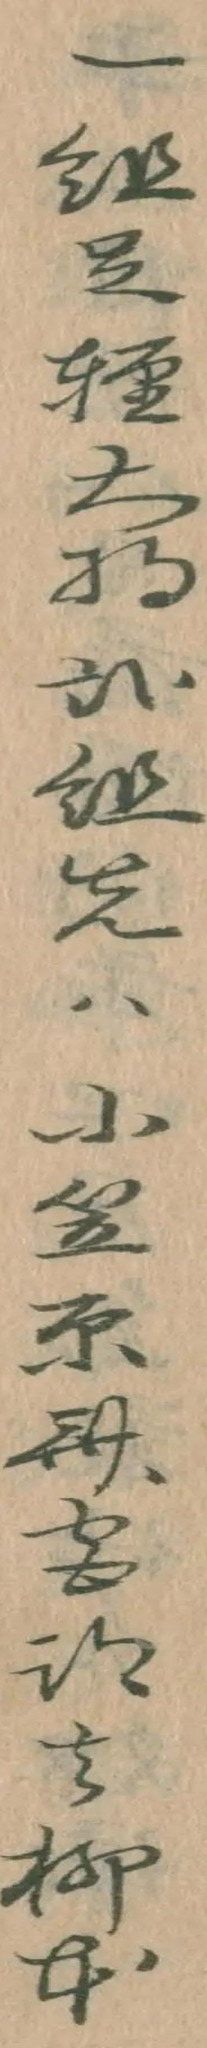一組足軽大将弐組先は小笠原斎宮跡は柳本
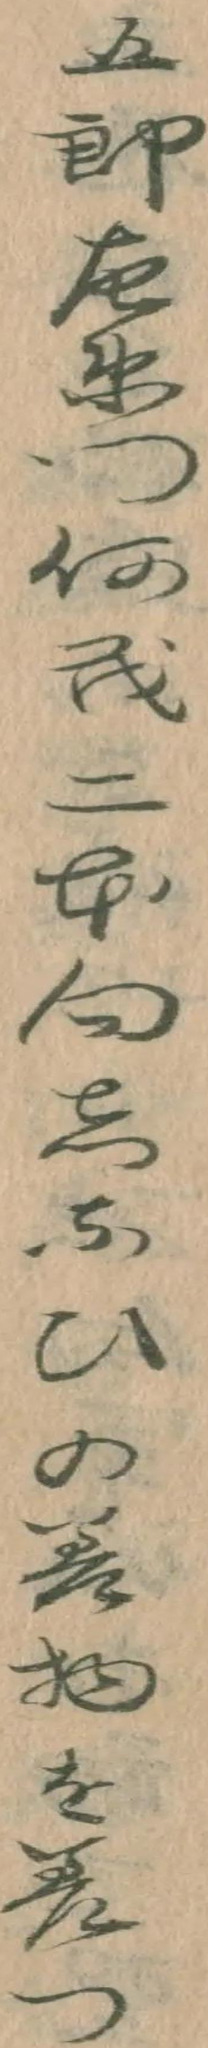五郎左衛門何も二本向はなひの差物を差つ
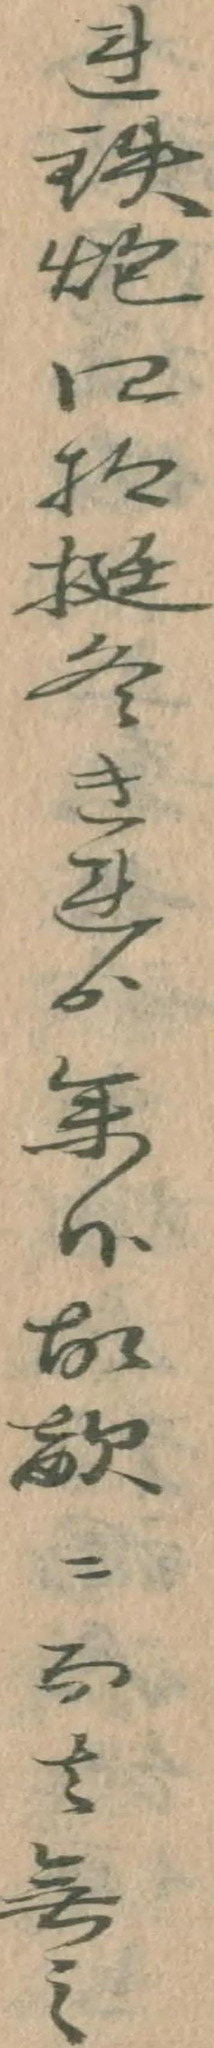れ鉄砲四拾挺冬きれゟ参候故敵に而は無之
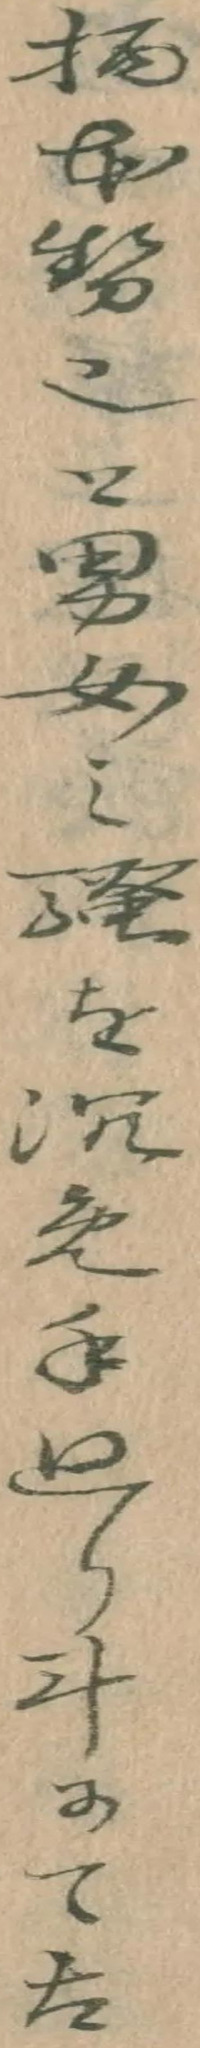柄本勢也と男女之騒を沈め手廻り斗にて太
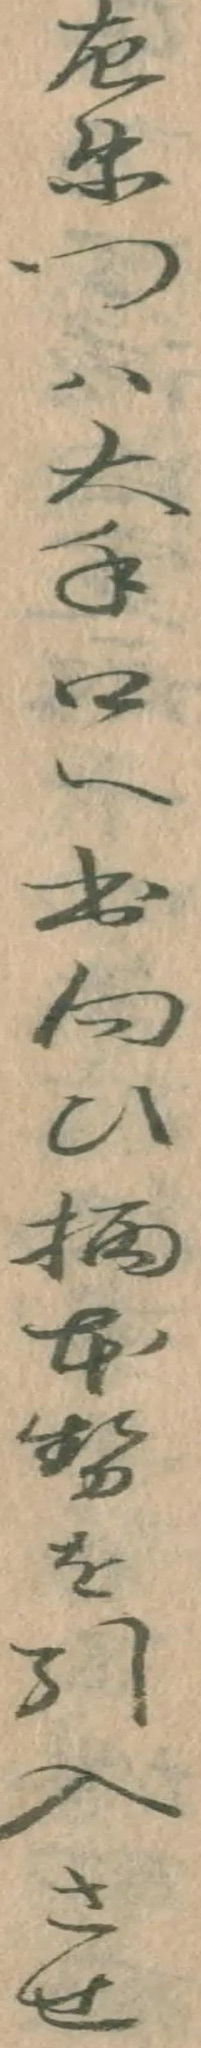左衛門は大手口へ出向ひ柄本勢を引入させ
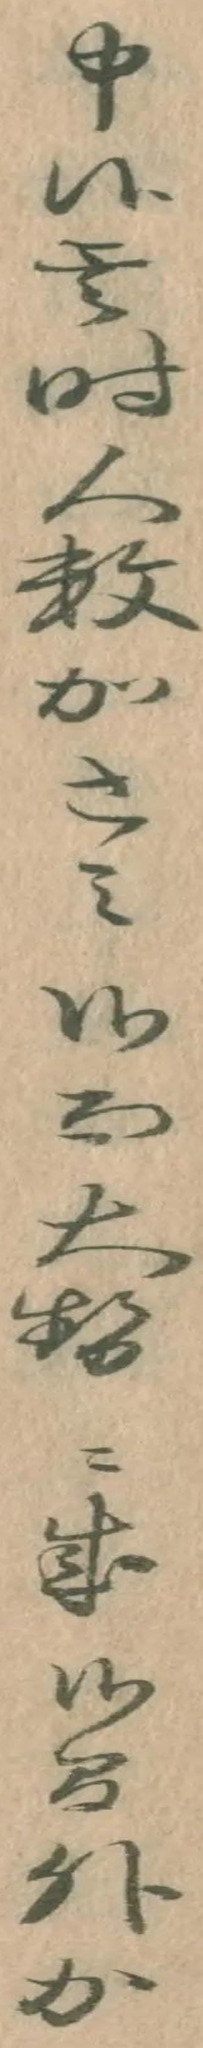申候其時人数かさみ候而大勢に成候間外か
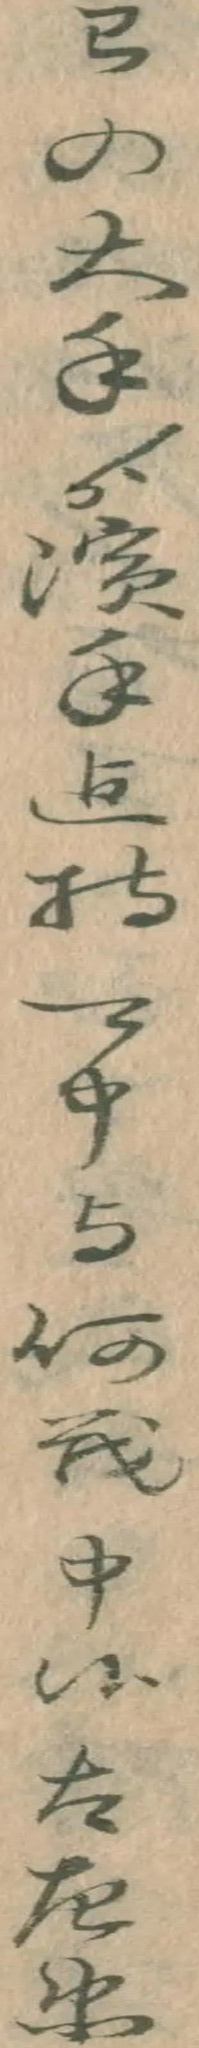わの大手ゟ浜手迄持可申と何も申候太左衛
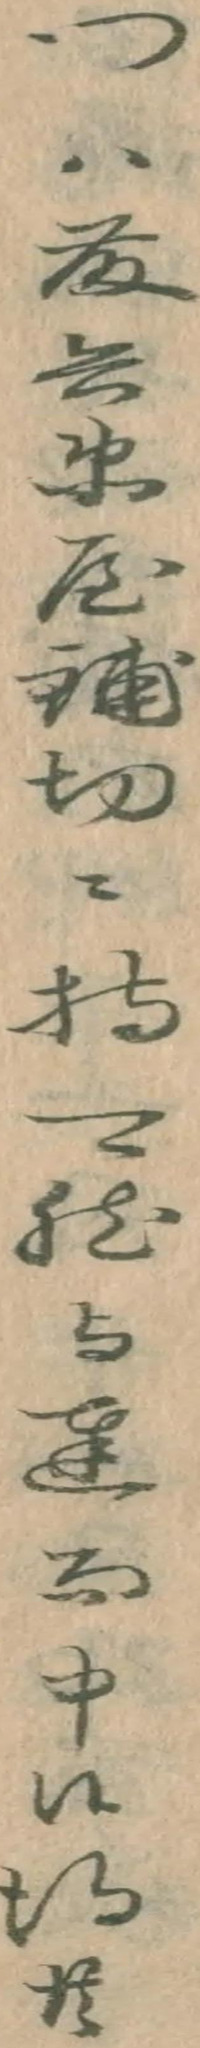門は藤兵衛屋敷切に持可然と達而申候得共
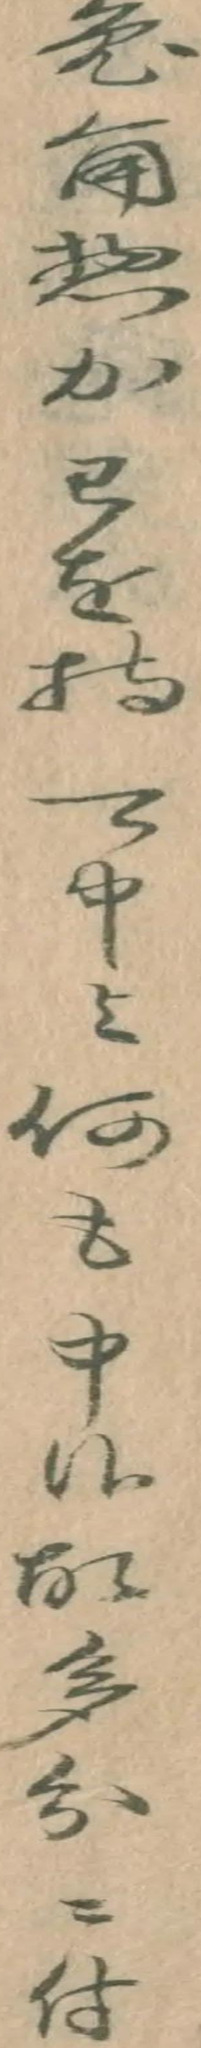兎角惣かわを持可申と何も申候故多分に付

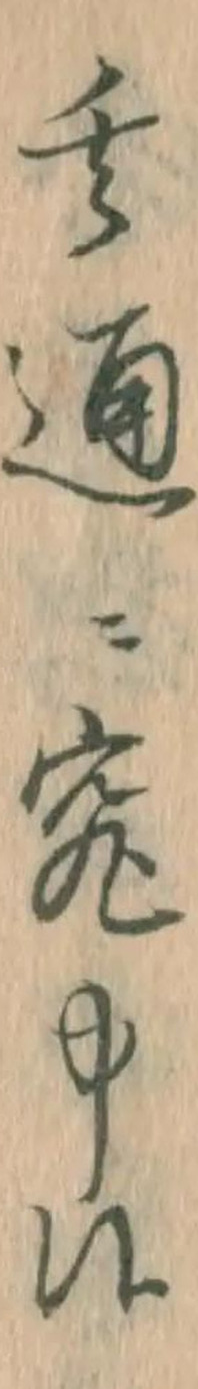其通に究申候
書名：切支丹御退治記 49巻. [3]
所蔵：国立国会図書館 National Diet Library, JAPAN
